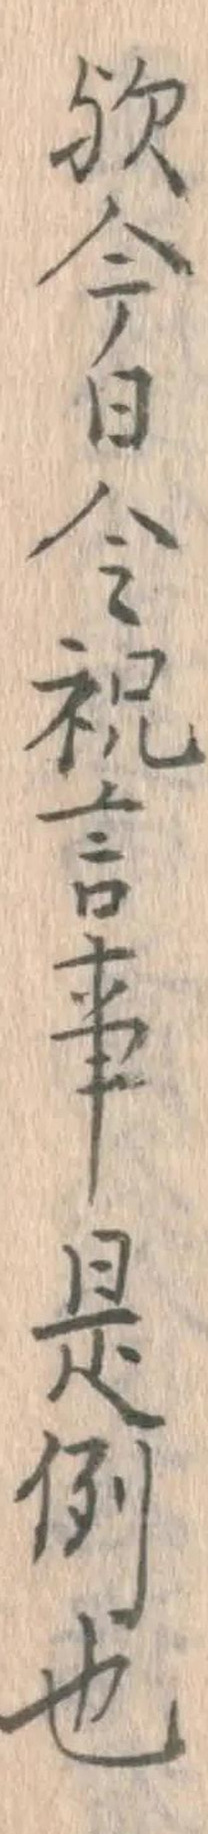歟今日令祝言事是例也
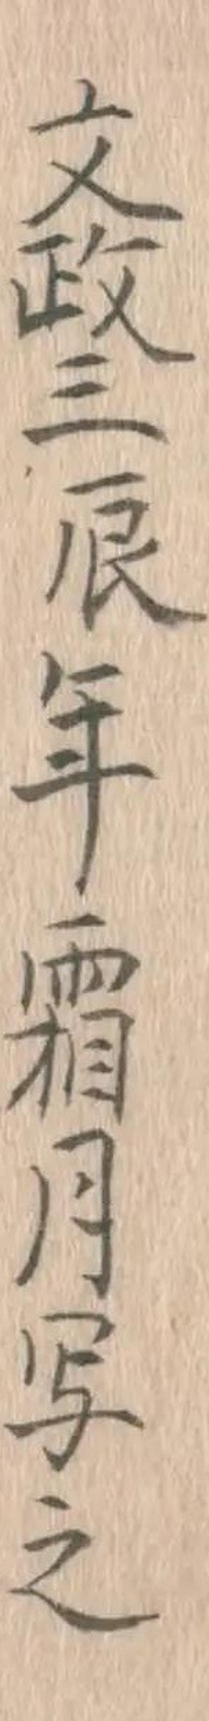文政三辰年霜月写之
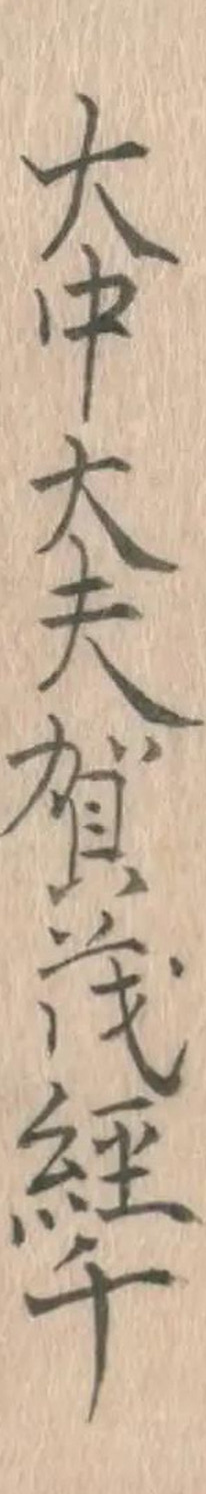大中大夫賀茂経千

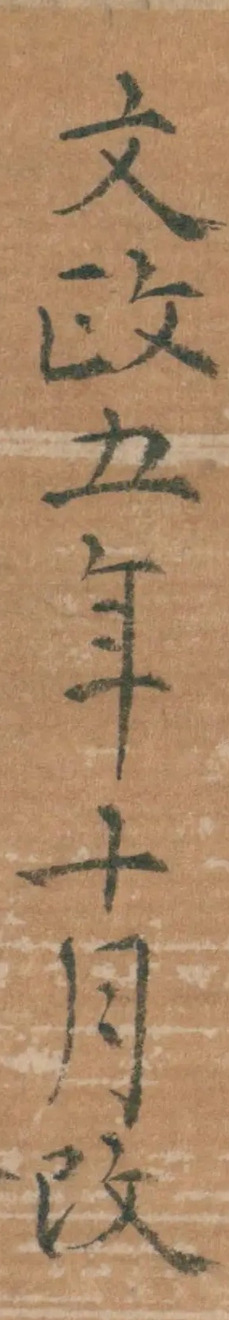文政五年十月改
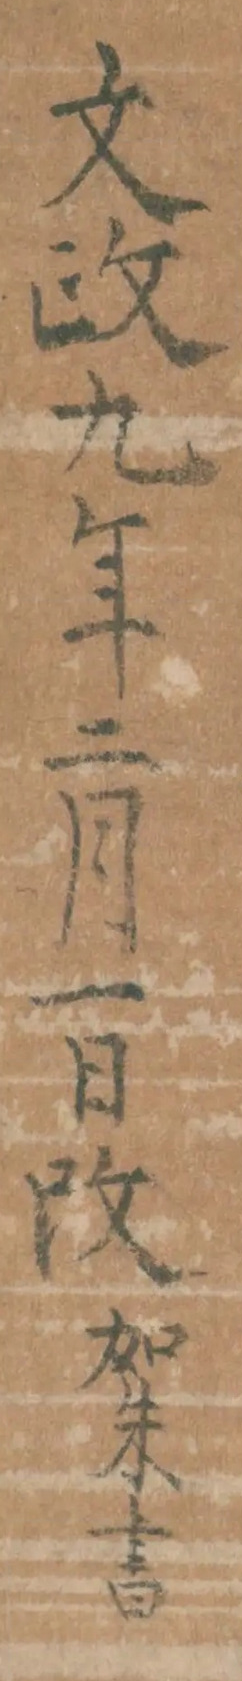文政九年二月一日改加朱書

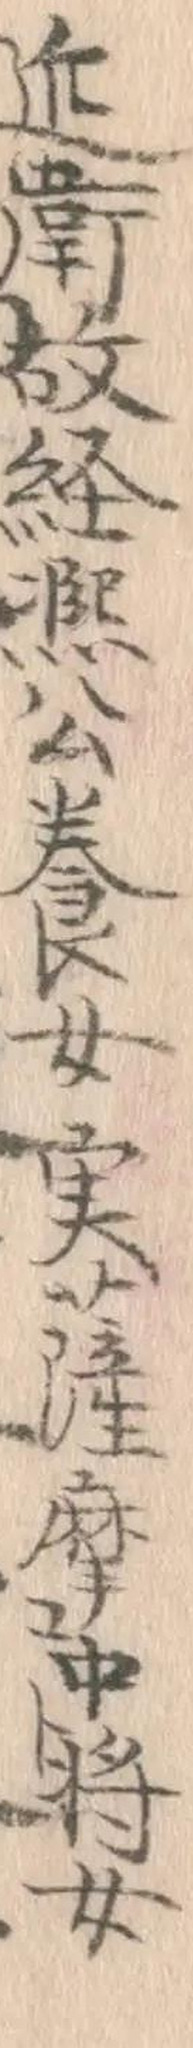近衛故経熈公養女実薩摩中将女
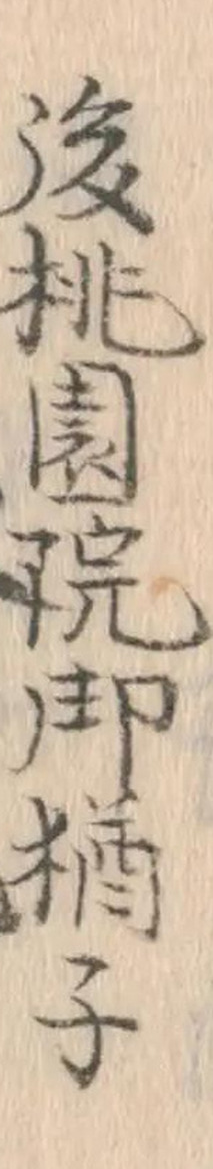後桃園院御猶子
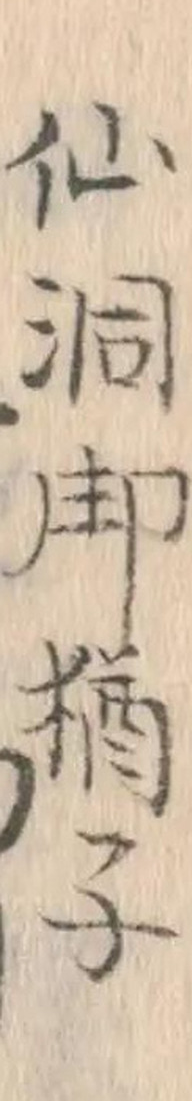仙洞御猶子

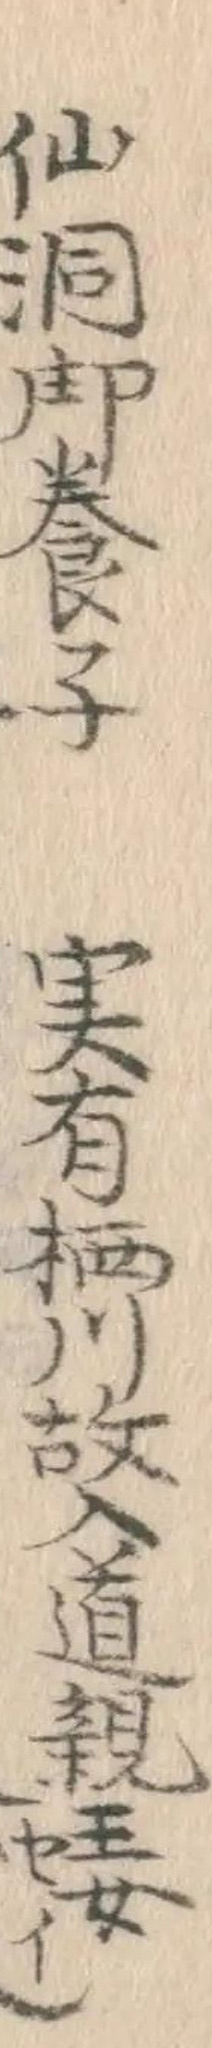仙洞御養子実有栖川故入道親王女
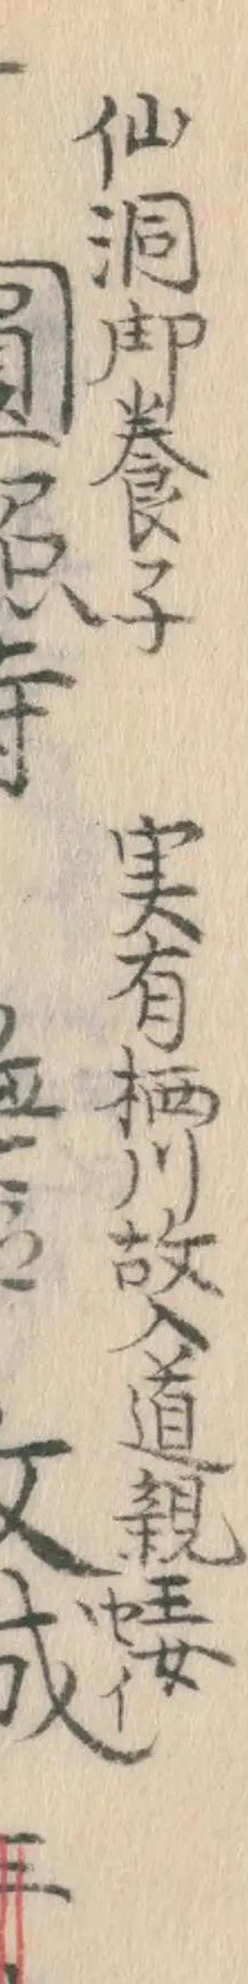仙洞御養子実有栖川故入道親王女
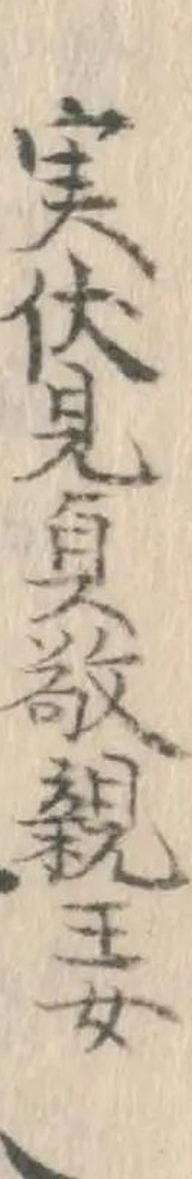同実伏見貞敬親王女
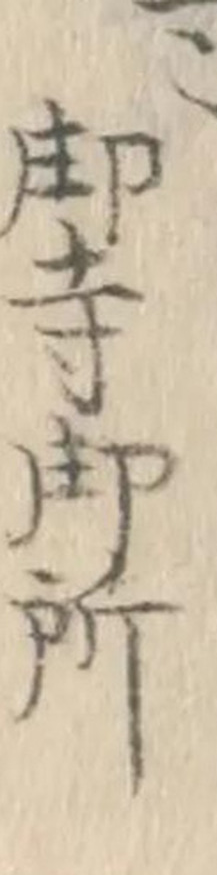御寺御所

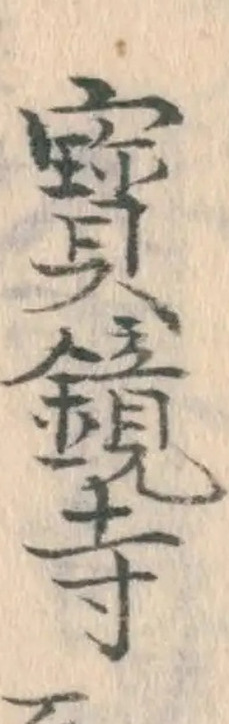宝鏡寺
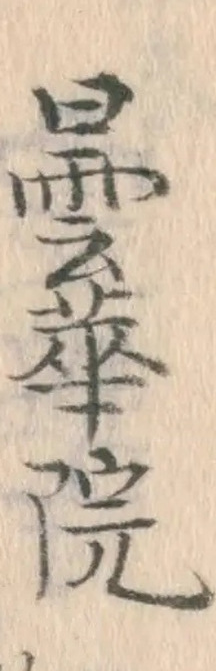雲華院
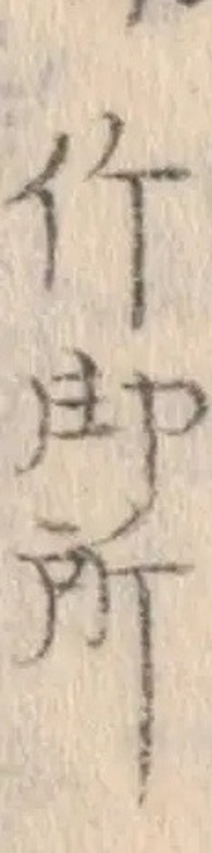竹御所
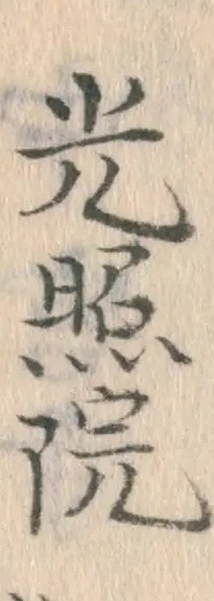光照院
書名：賀茂社記録. 第80冊
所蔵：国立国会図書館 National Diet Library, JAPAN
